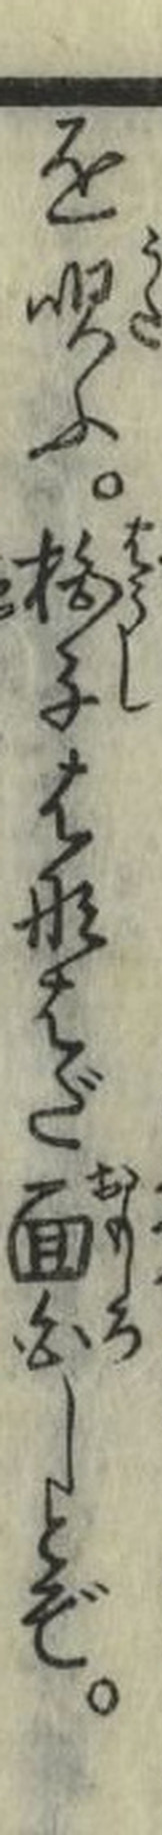を唄ふ。拍子はなはだ面白しとぞ。
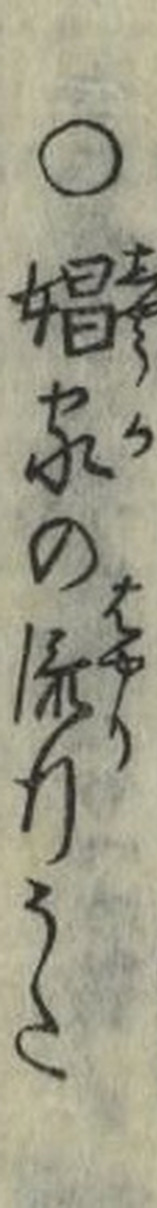○娼家の流行うた
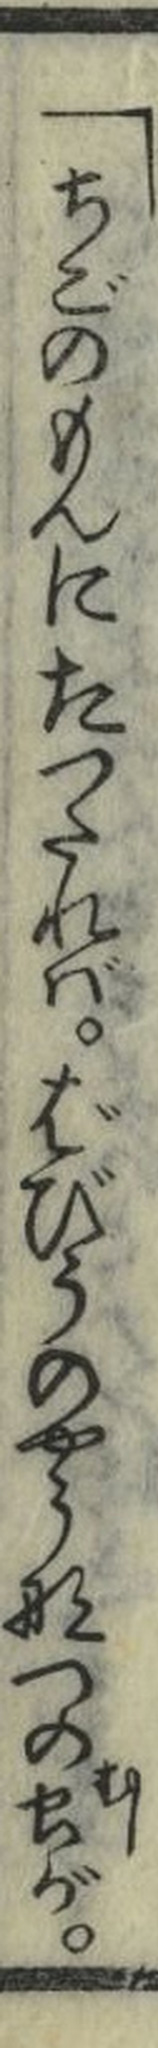〽ちごのもんにたつたれば。ばびうのやうなつの虫が。

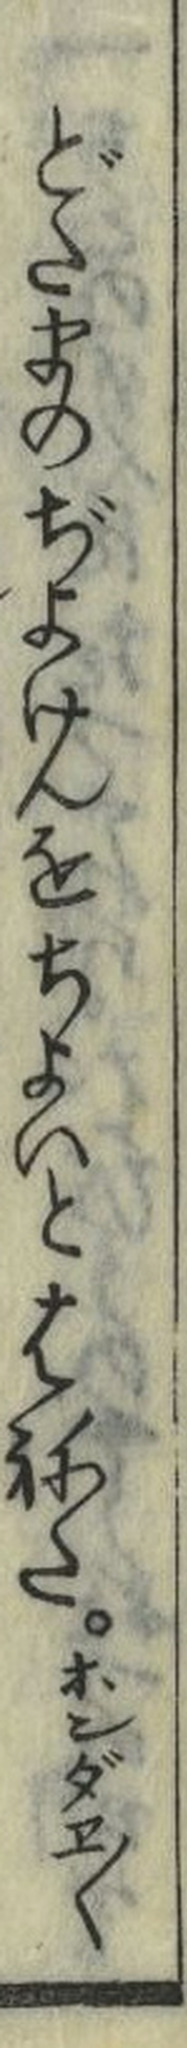どたまのぢよけんをちよいとはねた。ホンダヱ〳〵
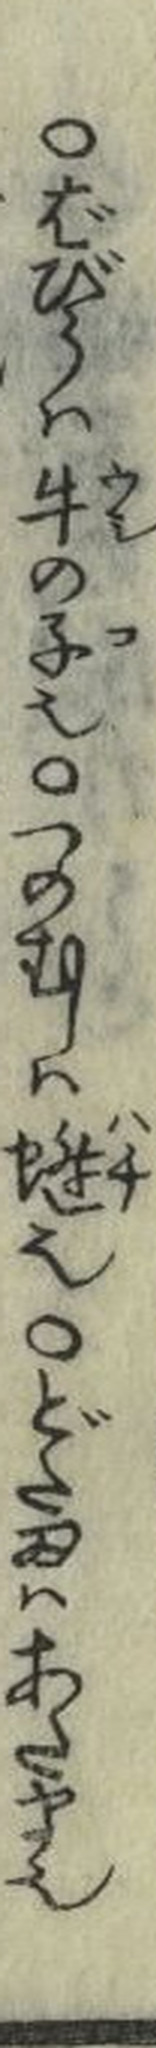○ばびうは牛の子也○つのむしは蜂也○どたまはあたま也
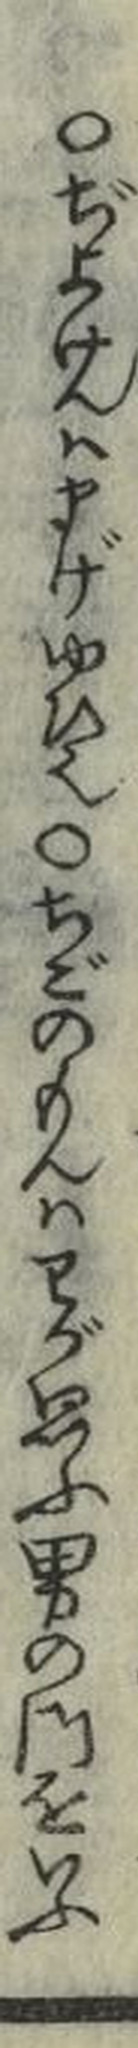○ぢよけんはまげゆひ也○ちごのもんはわが思ふ男の門をいふ。
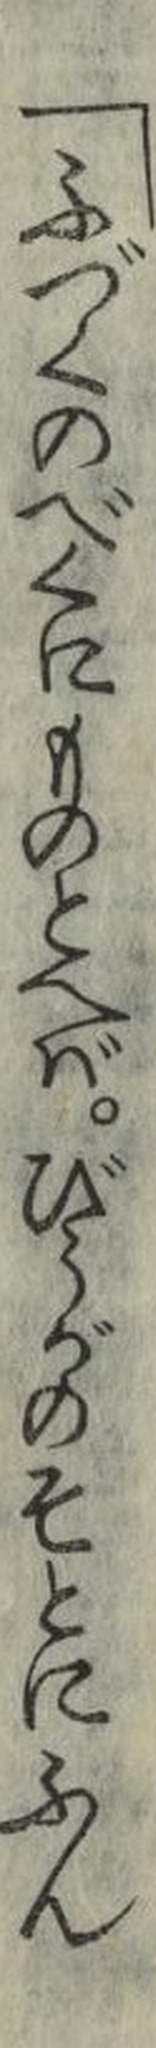〽ふづくのべくにものとへば。びうがのそとにふん
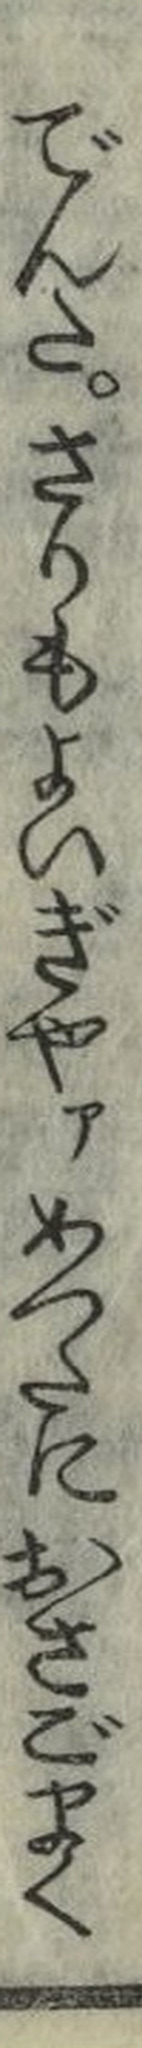でんた。さりもよいぎやアめつたにおさごまく。
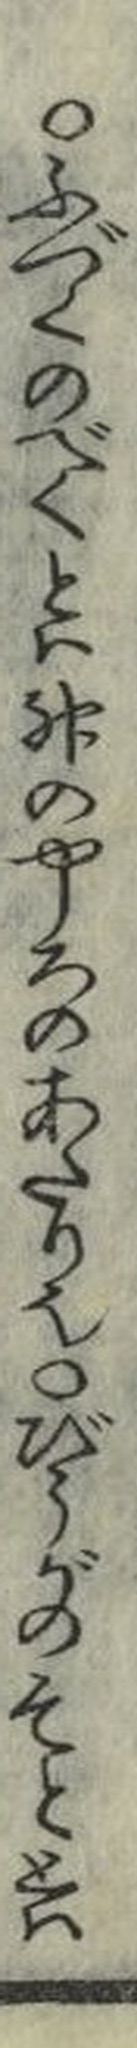○ふづくのべくとは神のやしろのあたり也○びうがのそととは
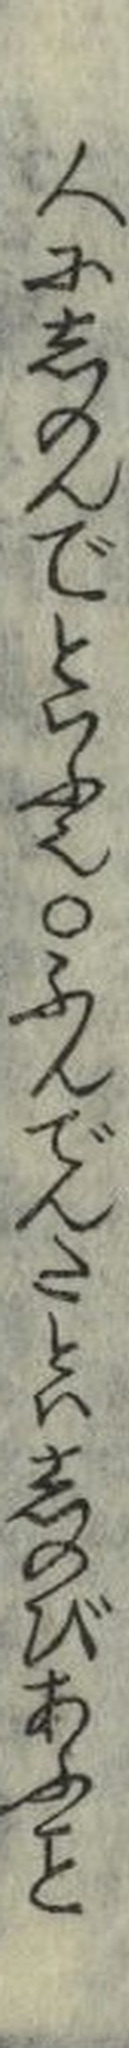人にしのんでといふ也○ふんでんたとはしのびあふこと
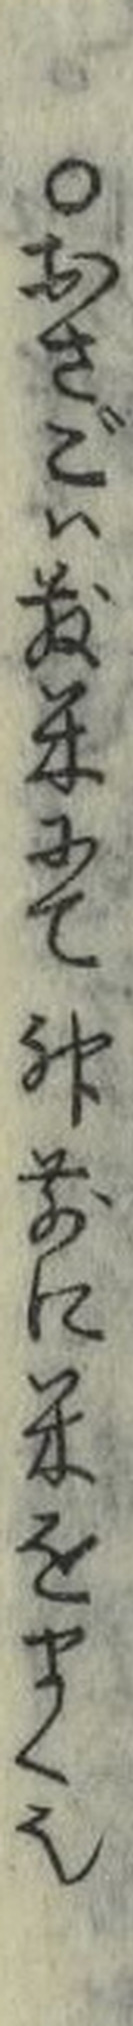○おさごは前米にて神前に米をまく也
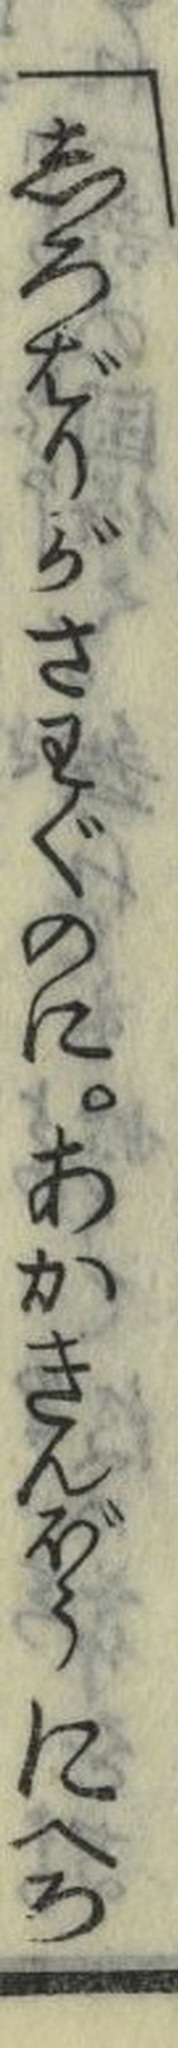〽しろばりがさわぐのに。あかきんぼうにへろ
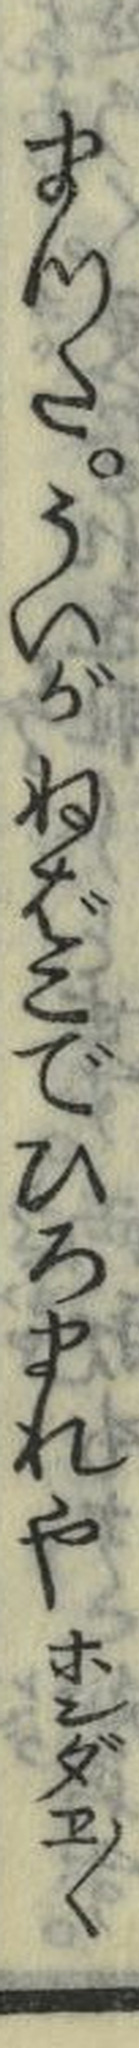まつた。ういがねばこでひろまれやホンダヱ〳〵
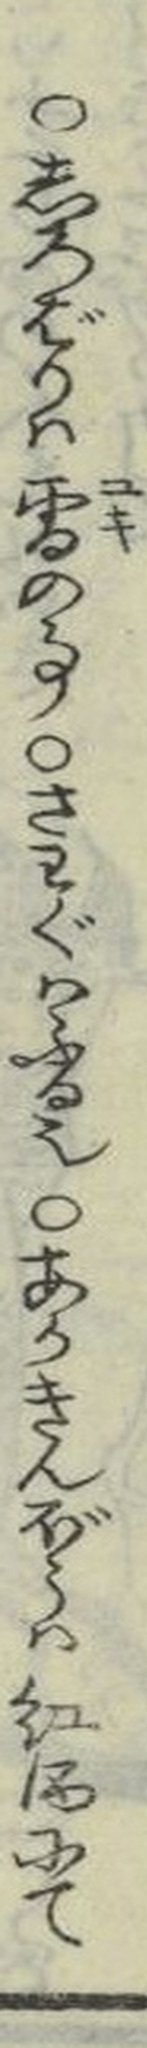○しろばりは雪の事○さわぐはふる也○あかきんぼうは紅酒にて
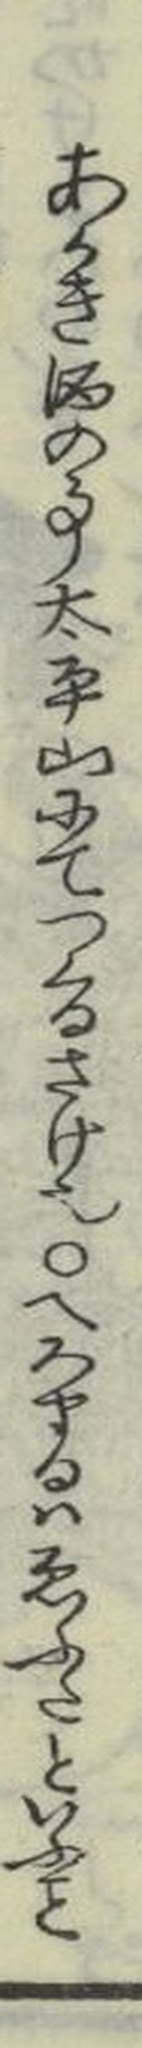あかき酒の事太平山にてつくるさけ也○へろまるはゑふたといふこと
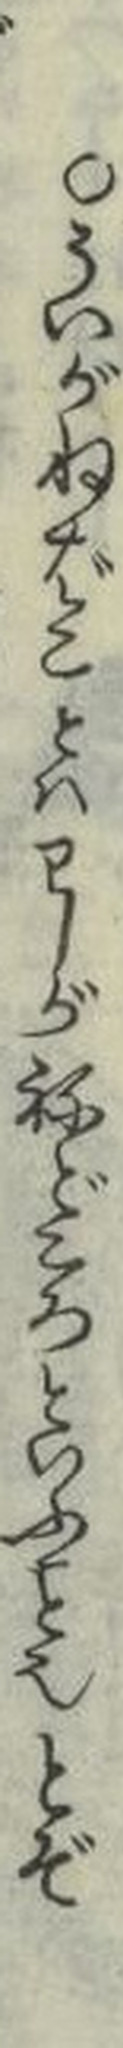○ういがねばことはわしがねどころといふこと也とぞ
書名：琉球奇譚
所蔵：University of the Ryukyus Library
